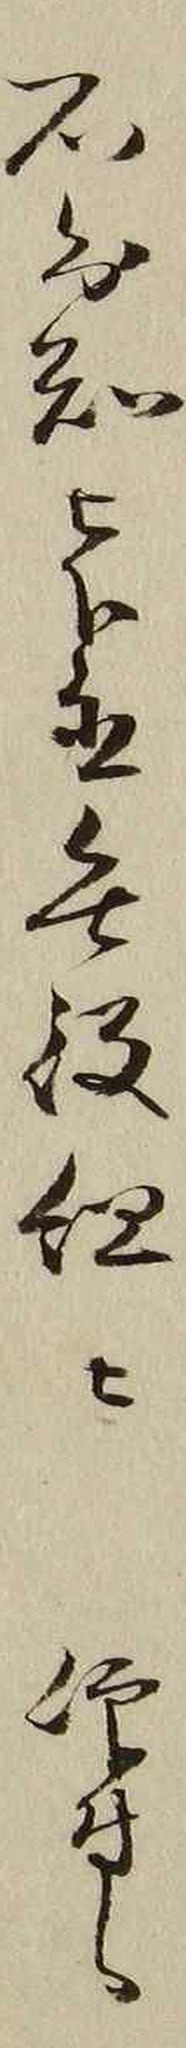石分知被下置無役組被仰付候
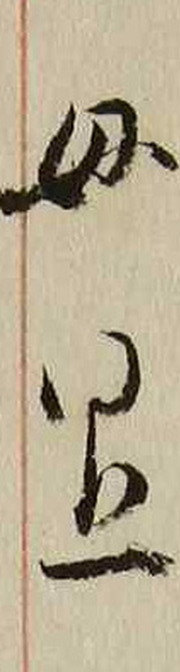母同上
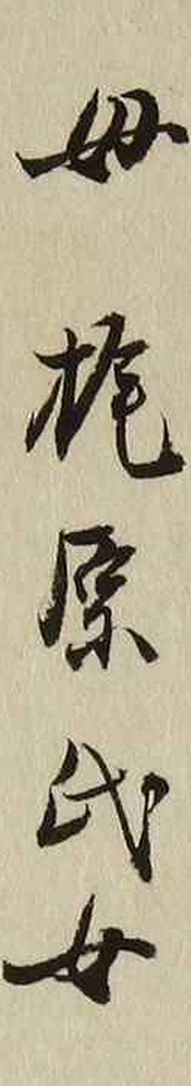母梶原氏女
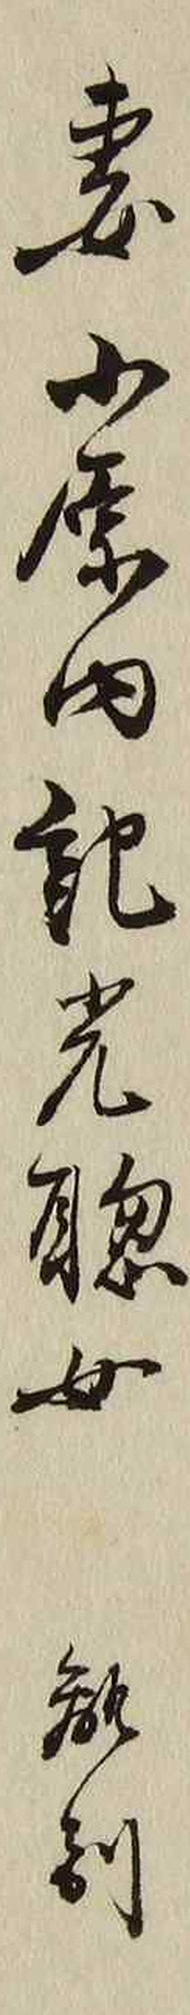妻小原内記光聦女離別
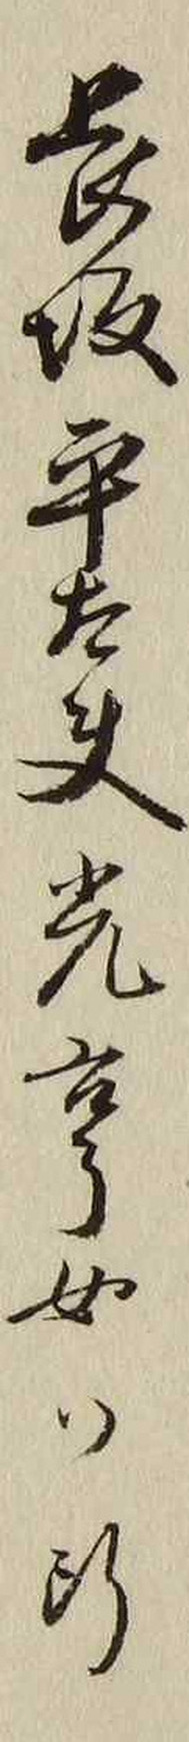長坂平太夫光亨女同断
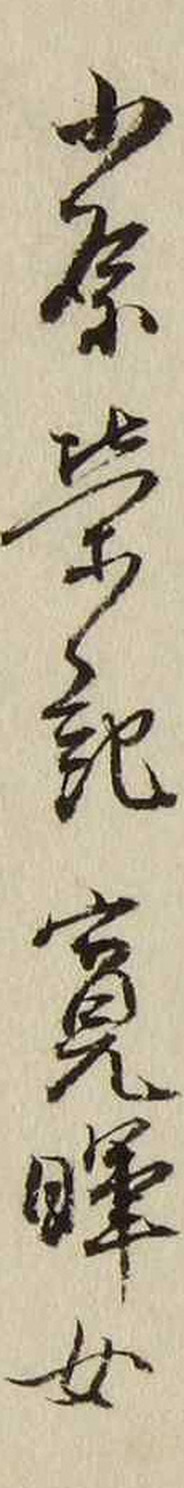小原栄記寛暉女

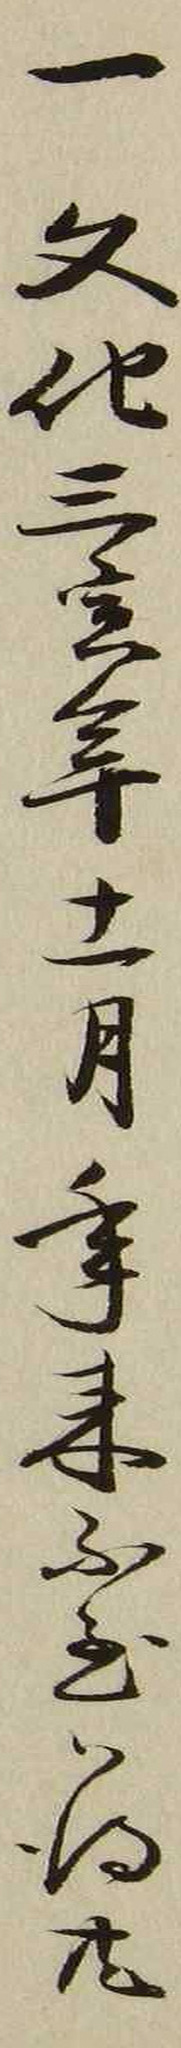一文化三寅年十一月年來不至候得共
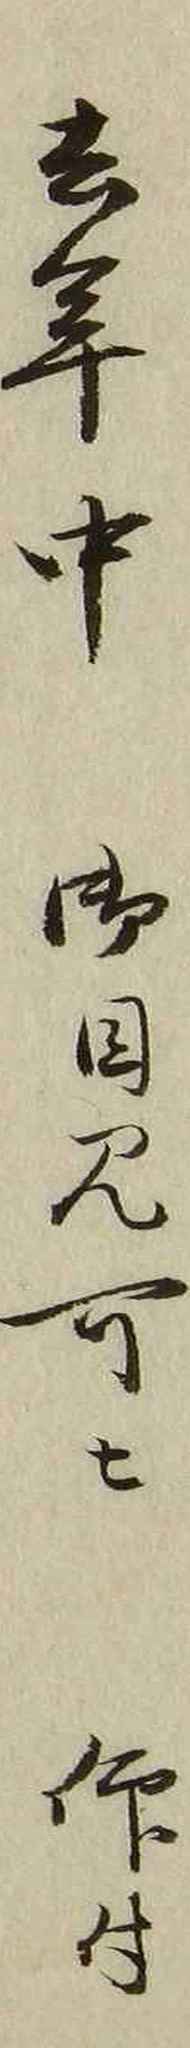去年中御目見可被仰付
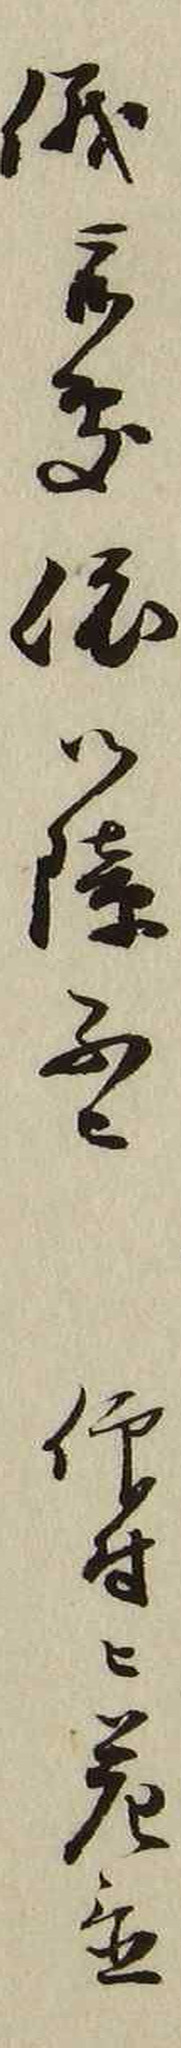儀に候処依御障不被仰付被差置
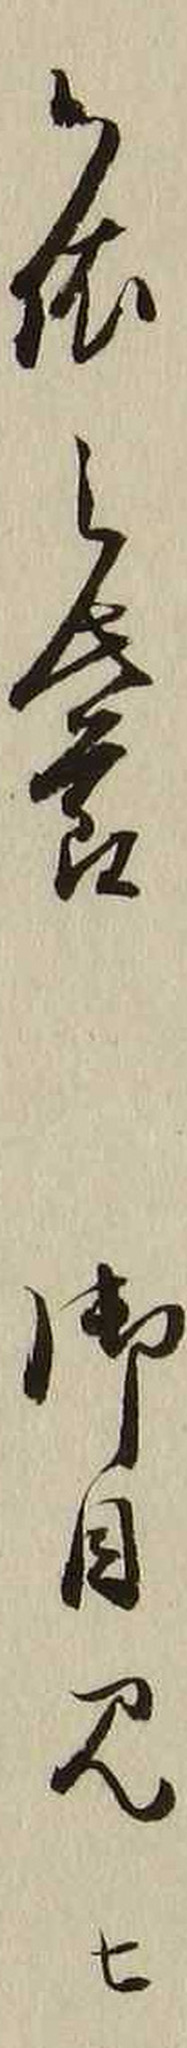候依之此節御目見被
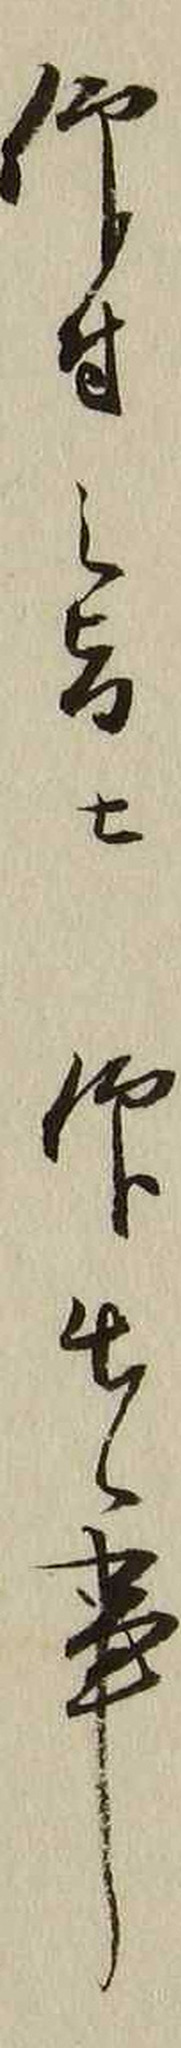仰付之旨被仰出候事
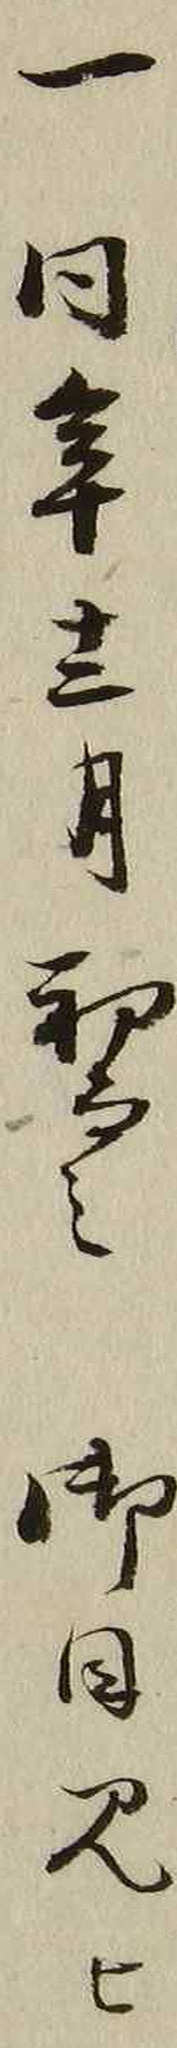一同年十二月初而之御目見被
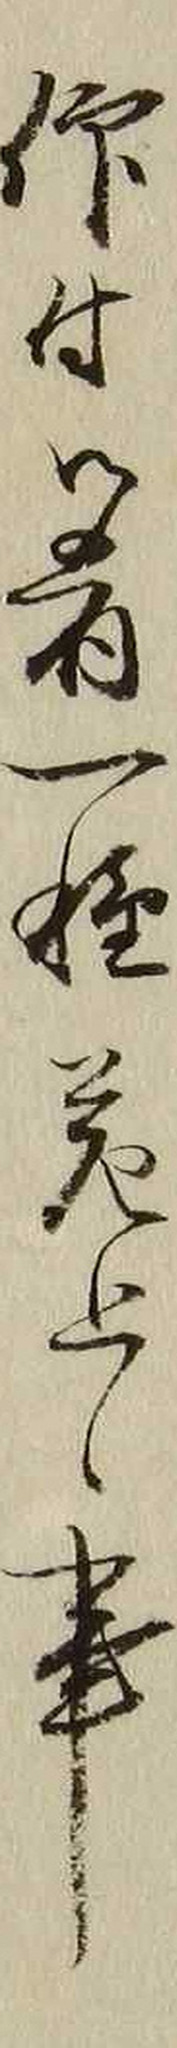仰付御肴一種差上候事
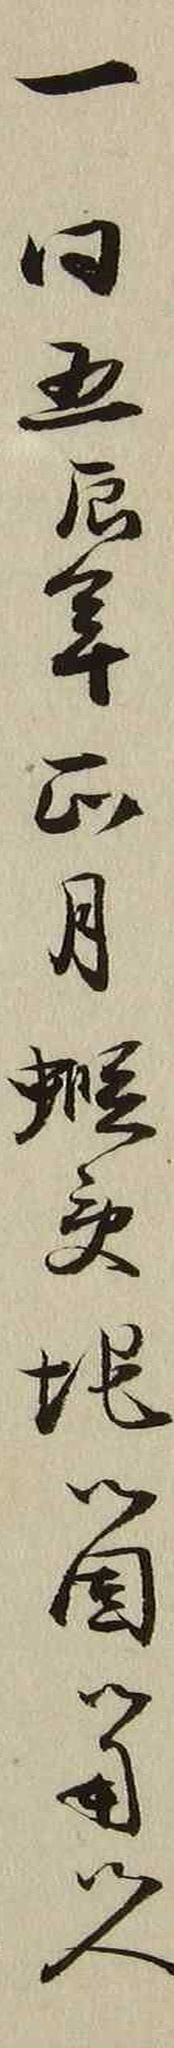一同五辰年正月蝦夷地御固御用御人
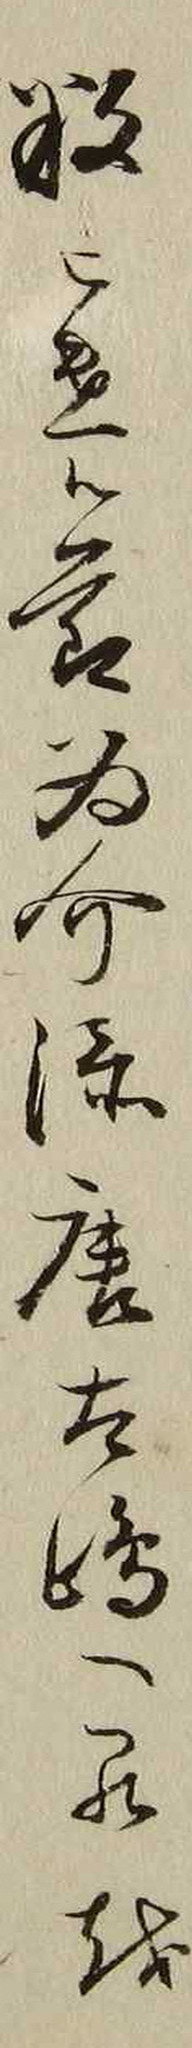数被遣候節為介添唐太嶋へ罷越
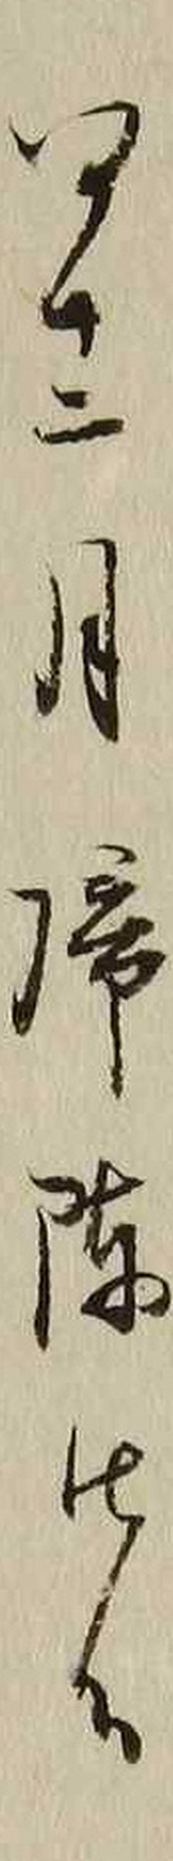同十二月帰陣仕候
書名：諸士系譜　巻之292　き之部1
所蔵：会津若松市立会津図書館
